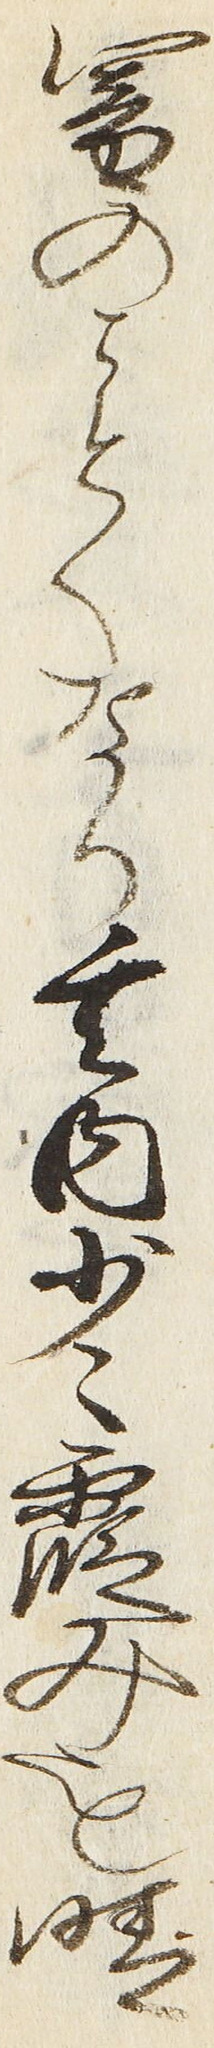のことくなり其内少々霞みも晴
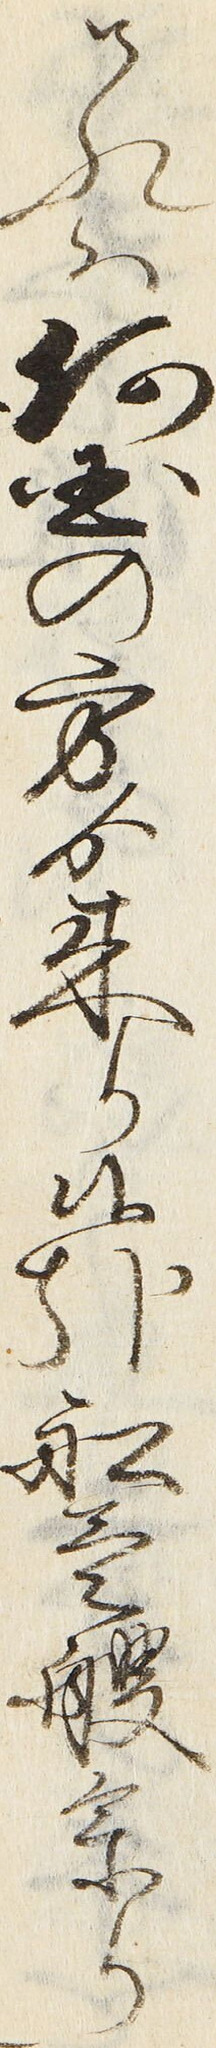けれは何国の方ゟ来り候哉船壱艘参り
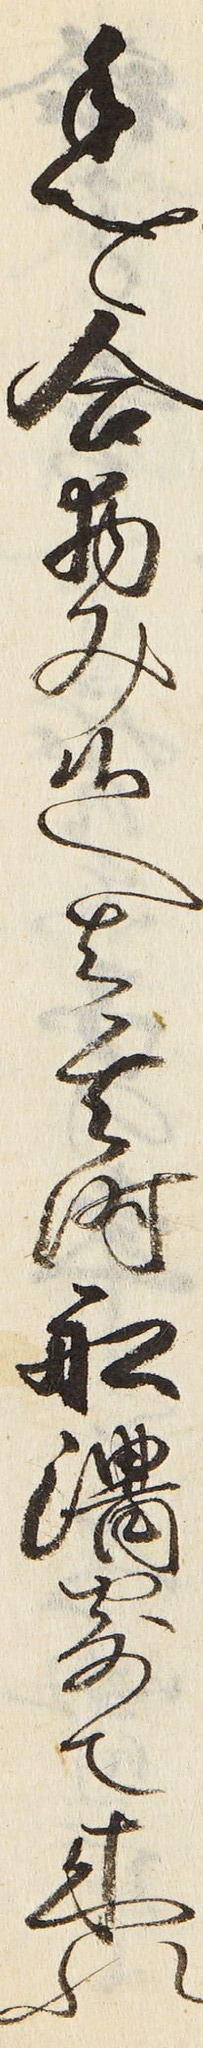手を合拝み候へは其時船漕寄て来れ
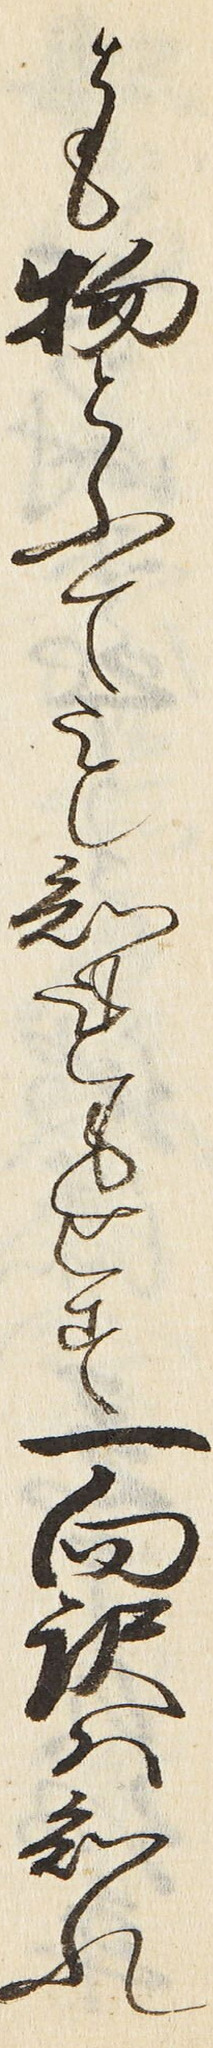とも物とふても知れもせす一向訳は知れ
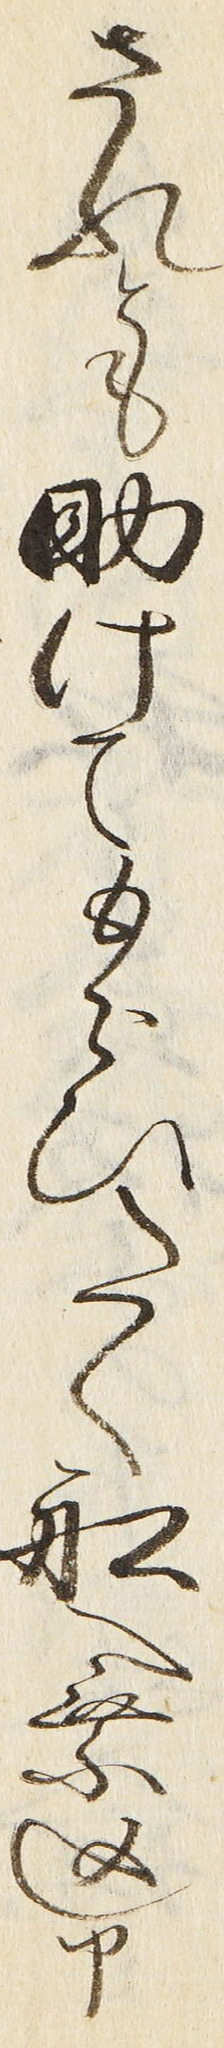されとも助けてもらひたく船へ乗込申
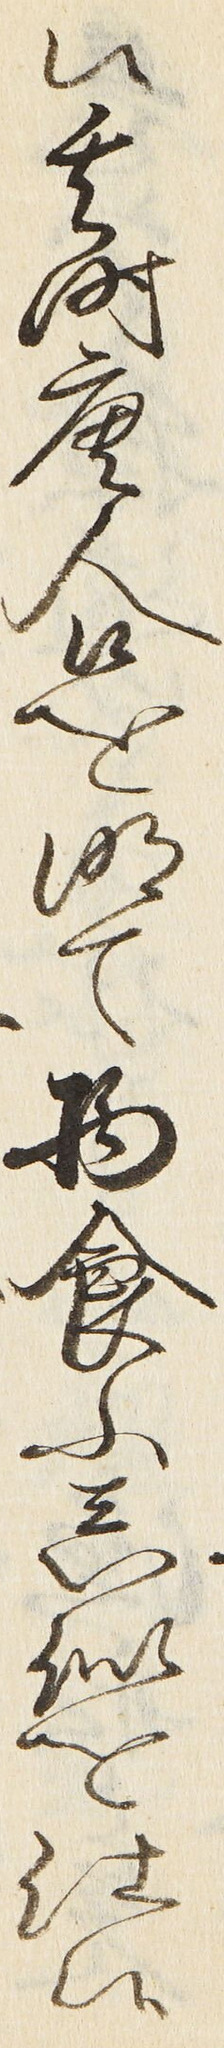候其時唐人口を明て物食ふ真似を仕候
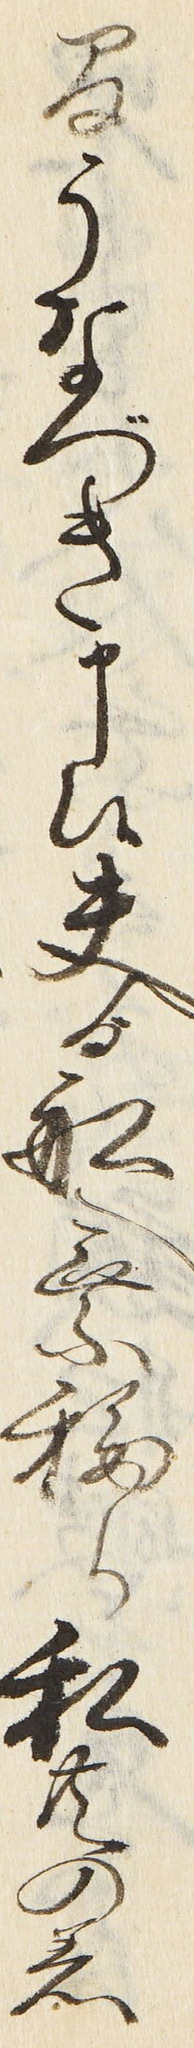間うなづき申候夫ゟ船へ乗移り私共の着
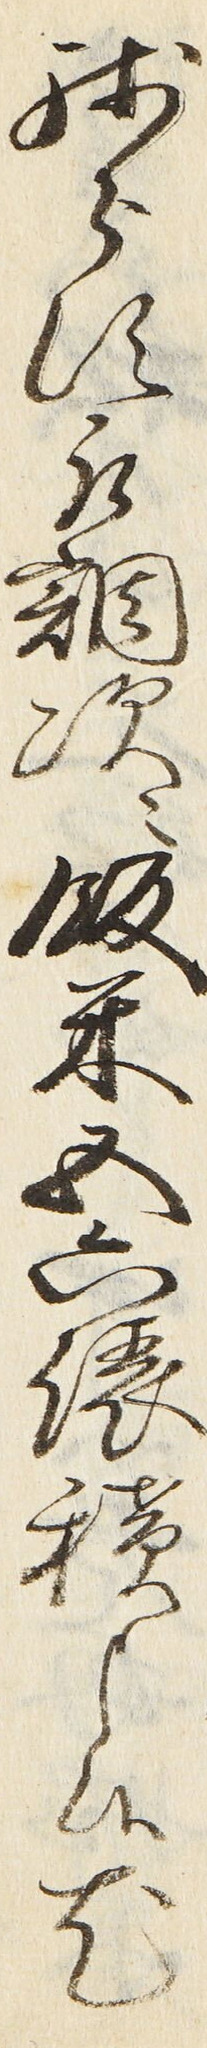残らす取調次に飯米五六俵積申候尤
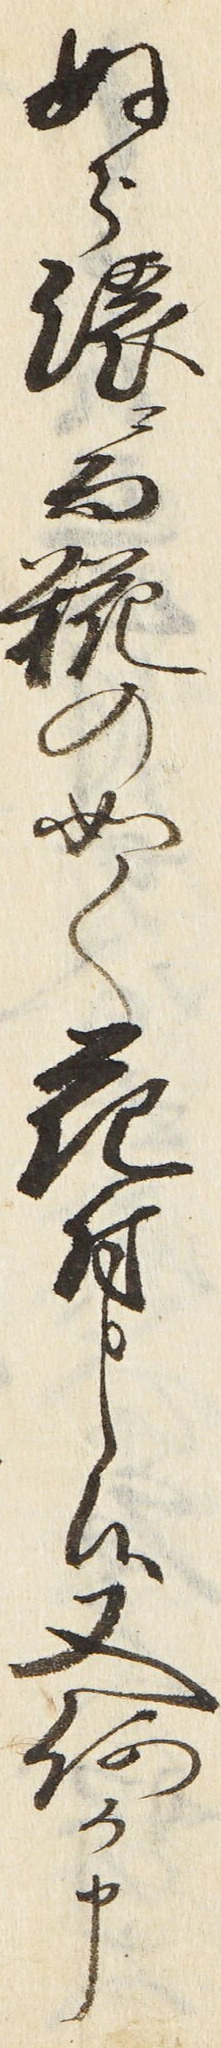ぬら俵にて糀の如く花付申候又何か申
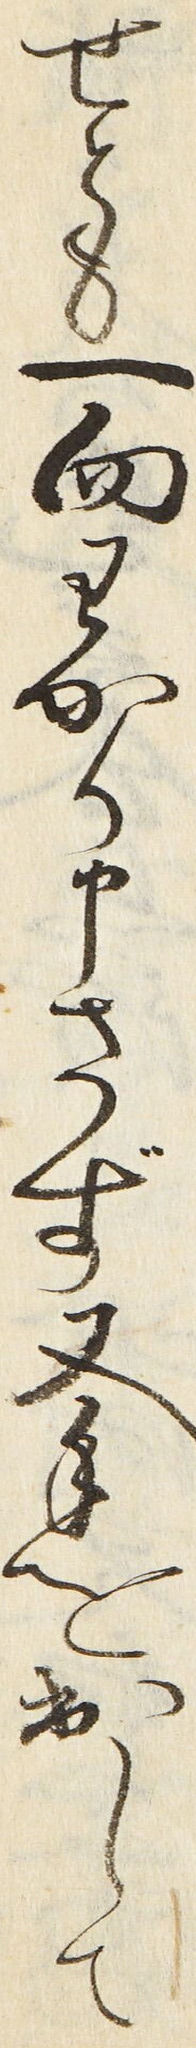せとも一向わかり申さず又手を出して
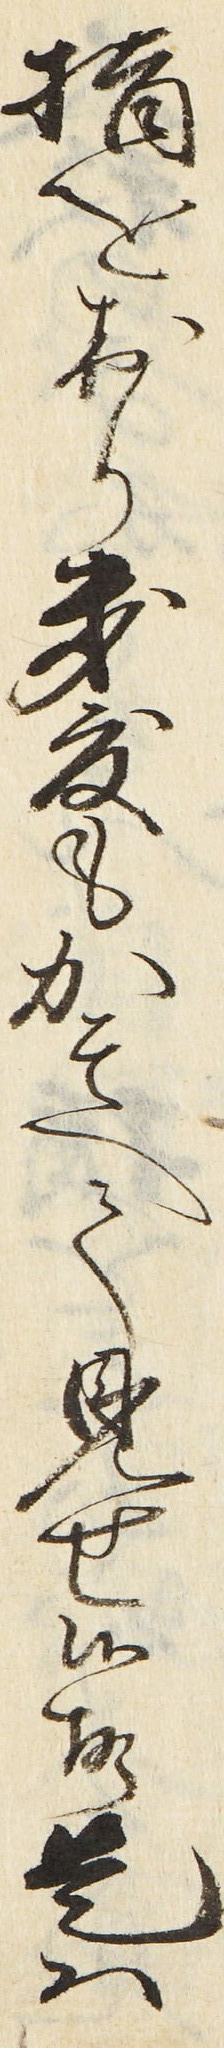指をおり幾度もかそへて見せ候故是は

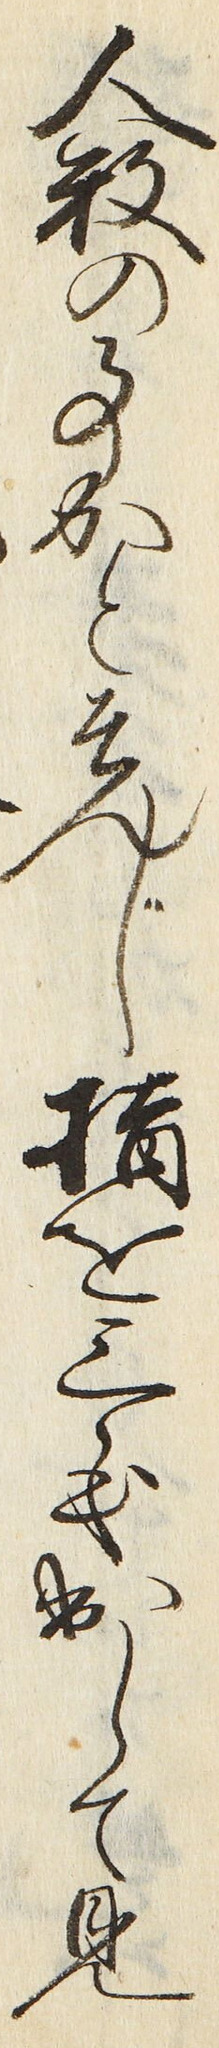人数の事かとそんじ指を三本出して見
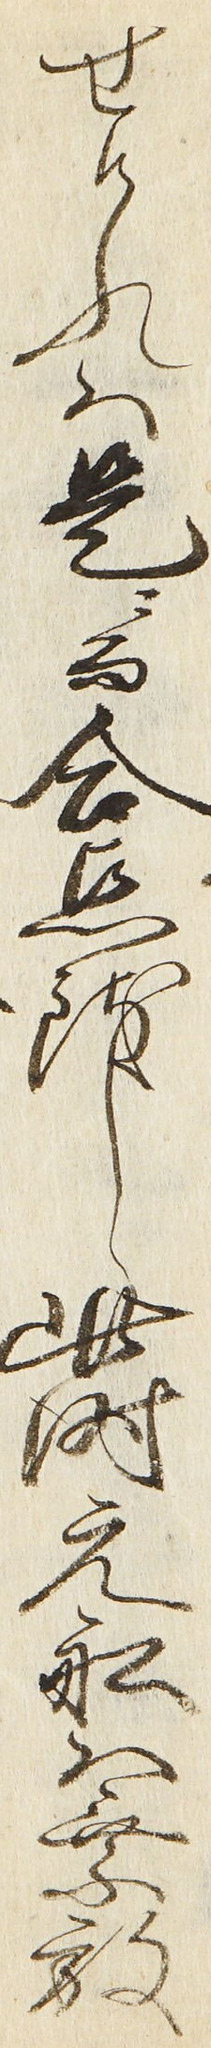せけれは是にて合点致し此時元船は乗放
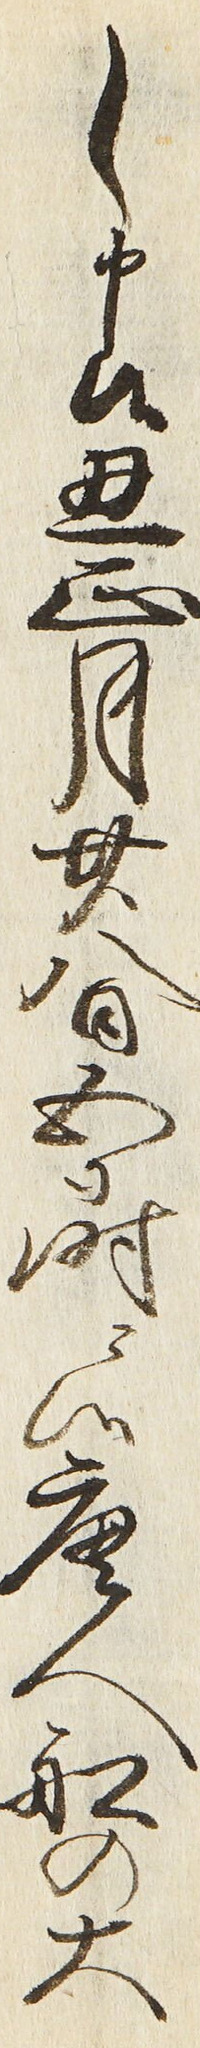し申候丑正月廿八日五ッ時に候唐人船の大
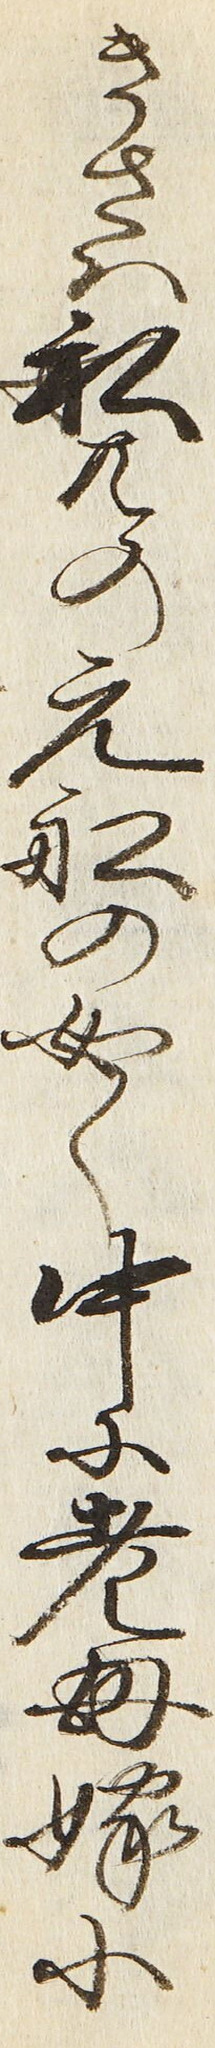きさは私共の元船の如く中に老母嫁小
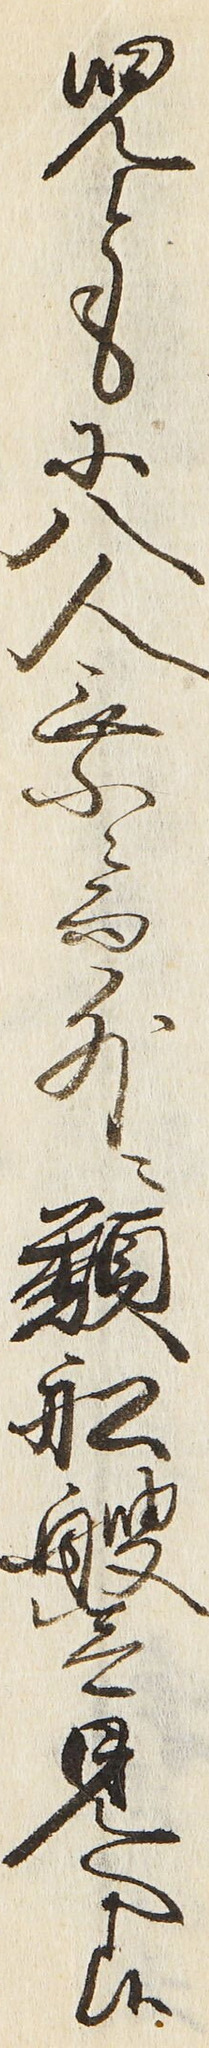児ともに八人乗にて外に類船艘壱見へ候
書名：天保漂流記
